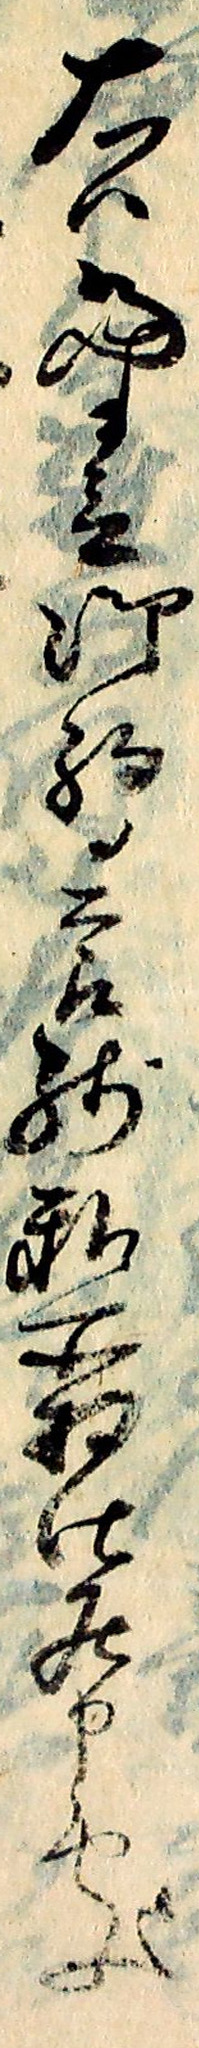右は当春御約め節残私所持仕居申処
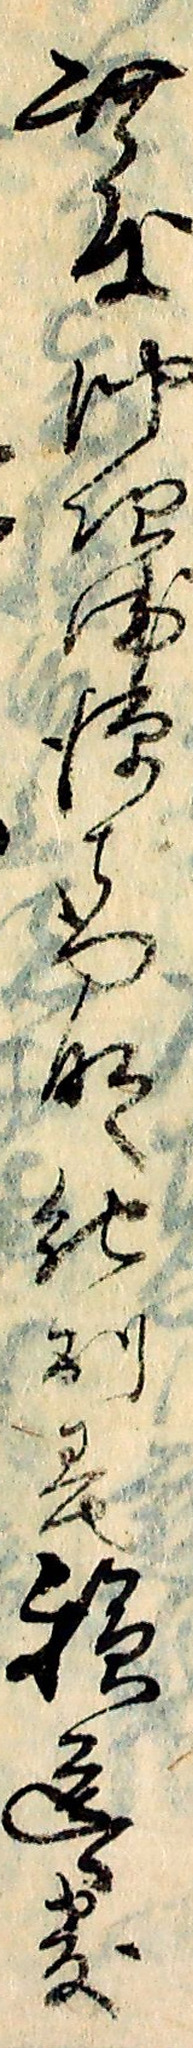此度沖須浦源右衛門船紀州表積送り申度
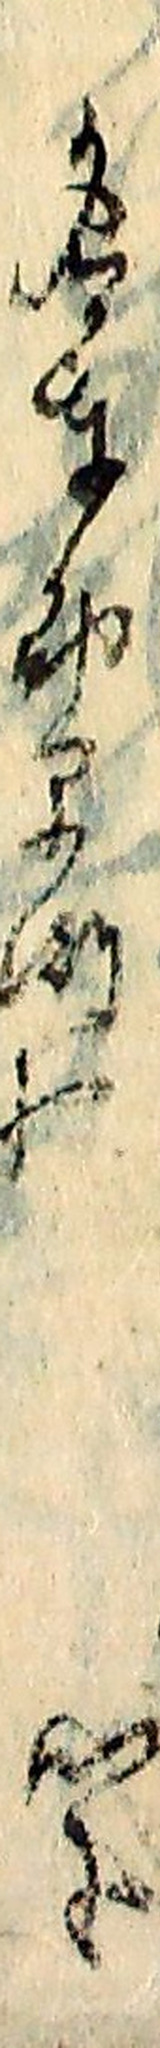名東郡早淵村
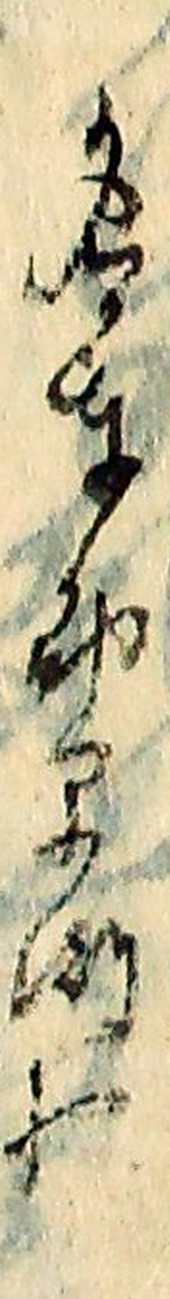名東郡早淵村
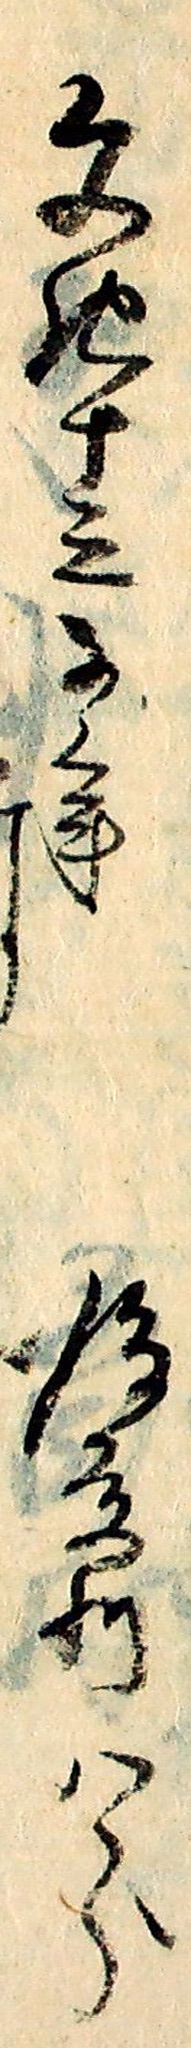文化十三子年後藤利八郎
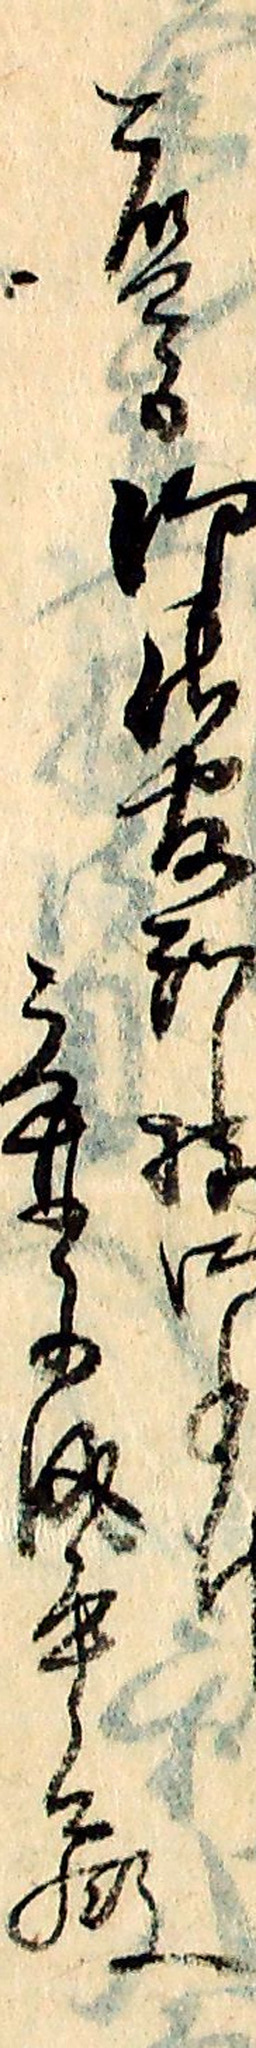兼子儀平殿
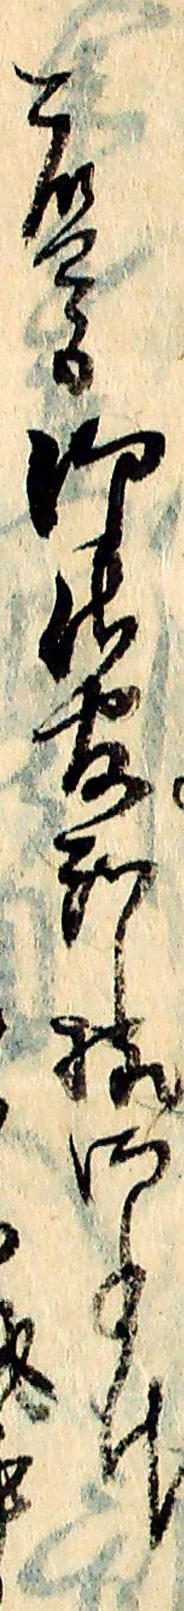藍方御代官所様御手代
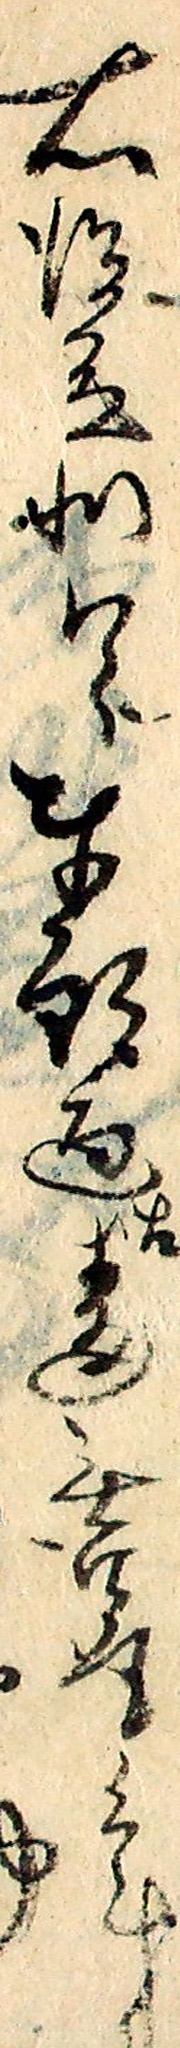右後藤利八郎奉願通相違無御座候に付
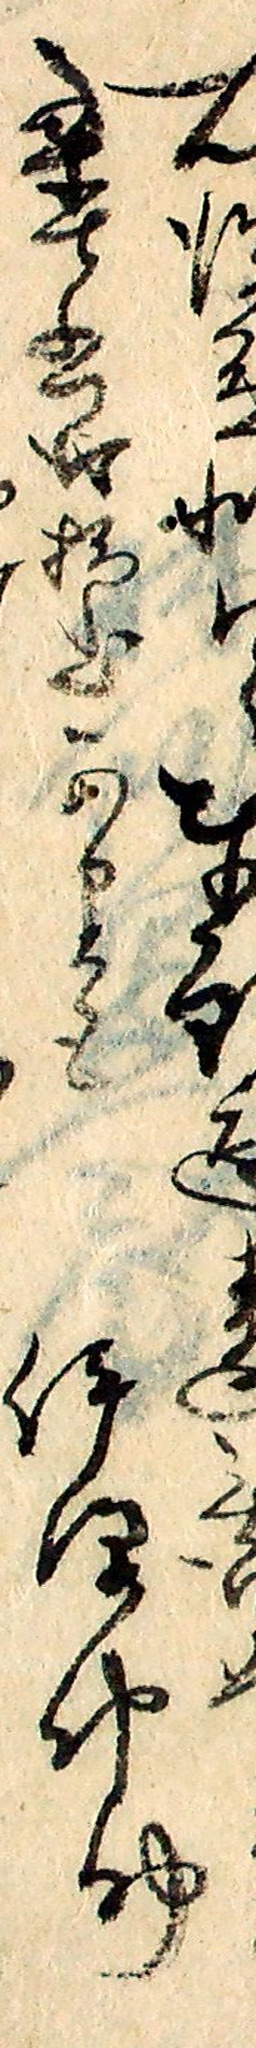奥書仕指上可申候以上伊沢仲助

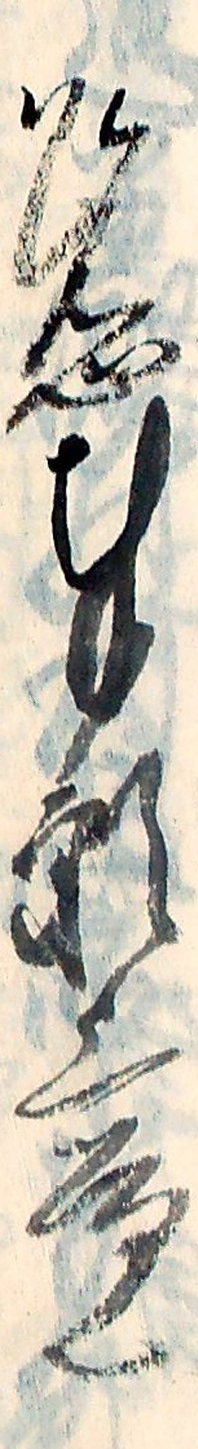乍恐奉願上覚
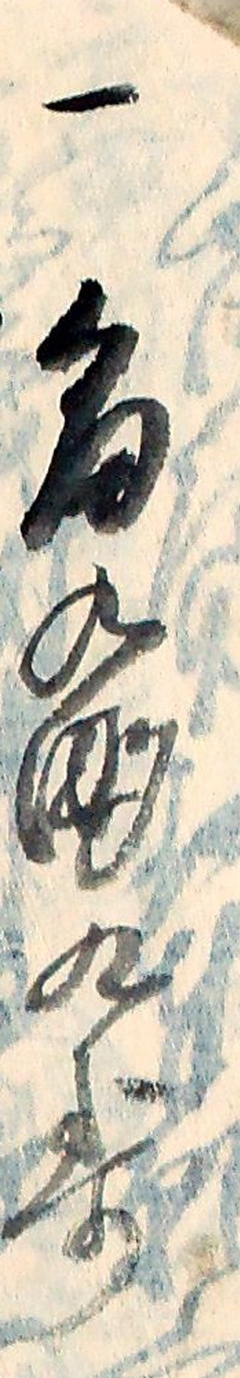一畠九畝九歩
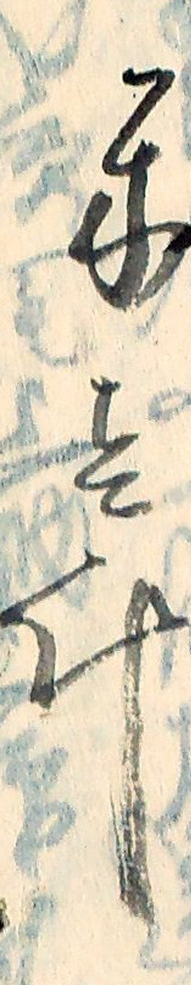米壱斗
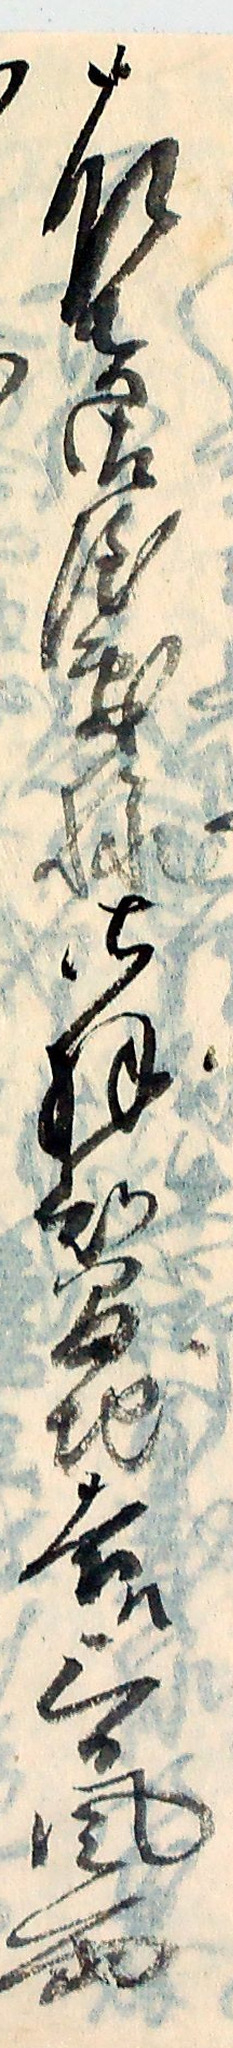右は御屋敷様御拝知間地去る三日風雨
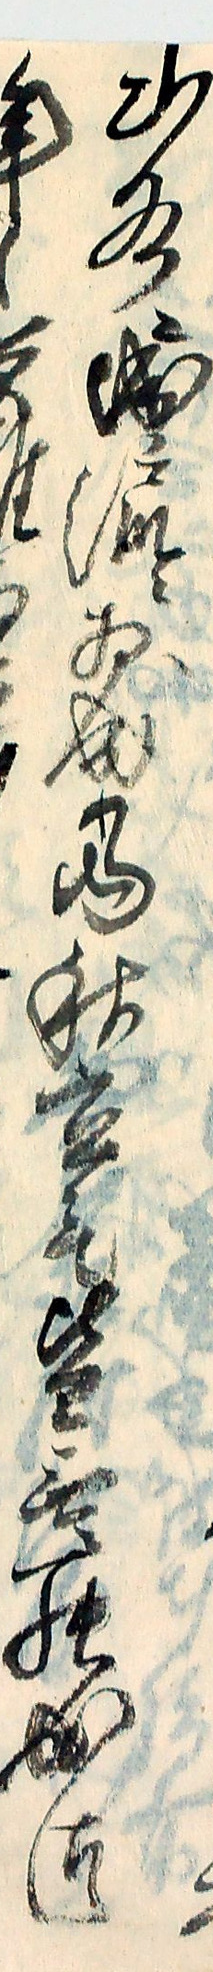出水と成流に相成当秋立毛皆無に罷成御
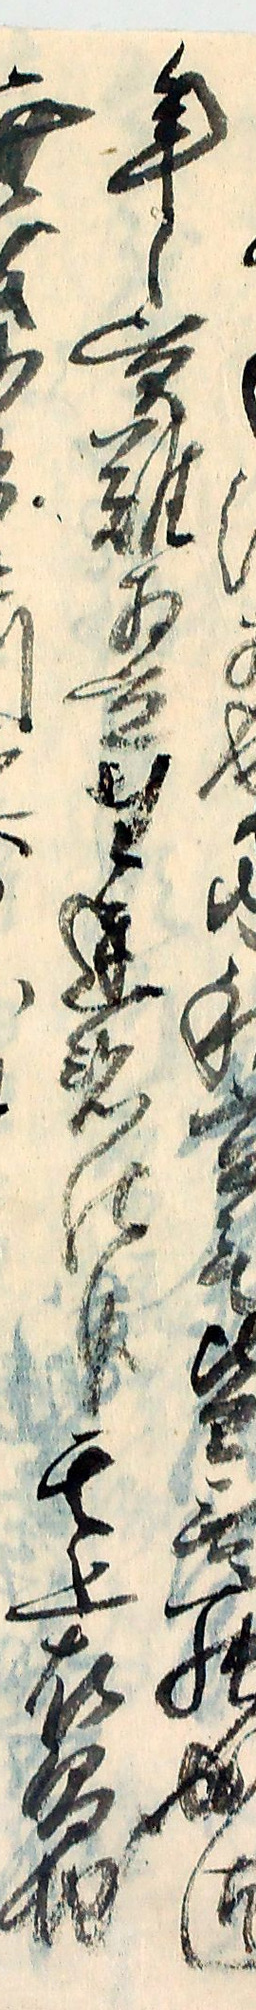年貢難相立奉迷惑仕候其上右間地
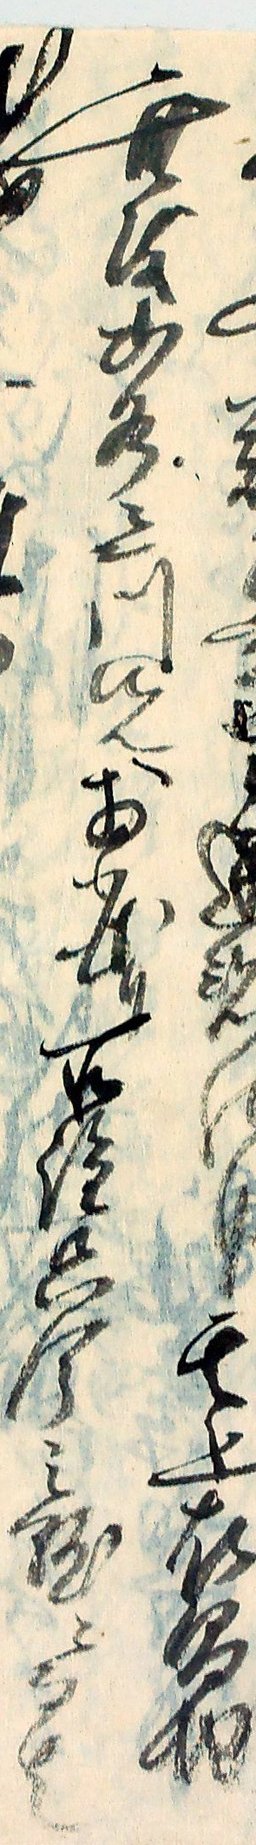此度出水にて川先へ相当り所詮只今之程にては
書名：諸御願書控(後藤氏壱番）
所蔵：鳴門教育大学 Naruto University of Education
